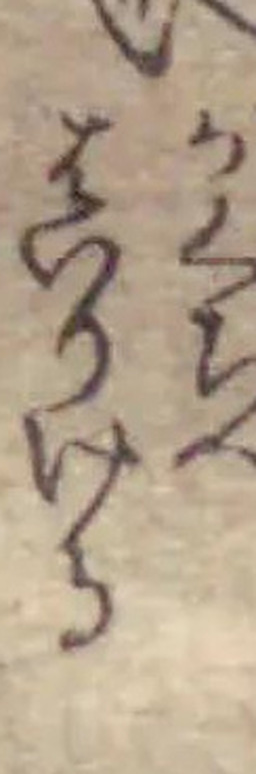はいりける
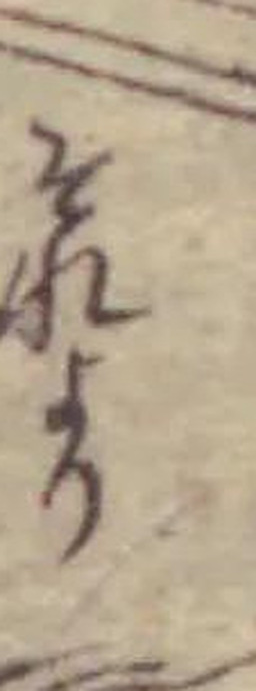それより
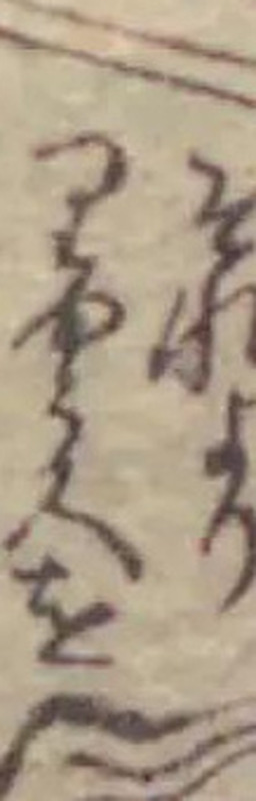りやう人を
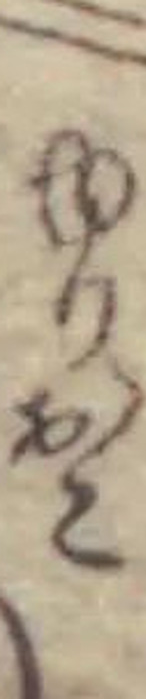ゆりおこ
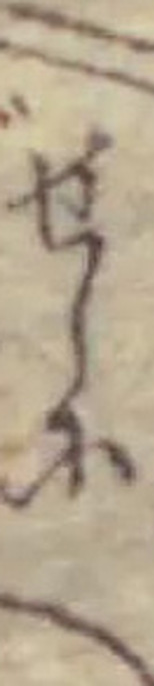せしに
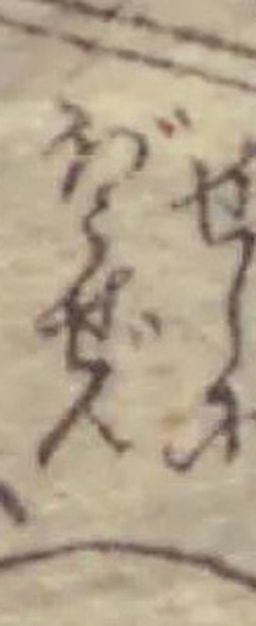ぼうぜん
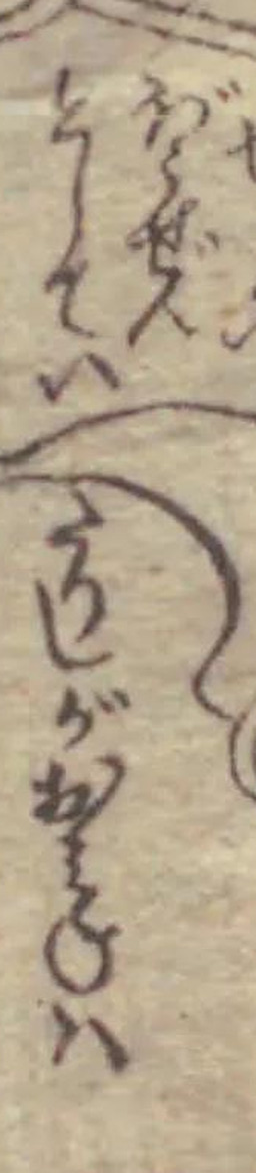としていたりしがおみねは
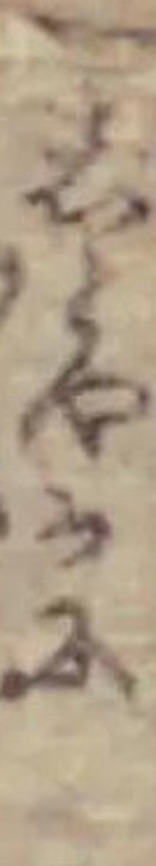しとやかに
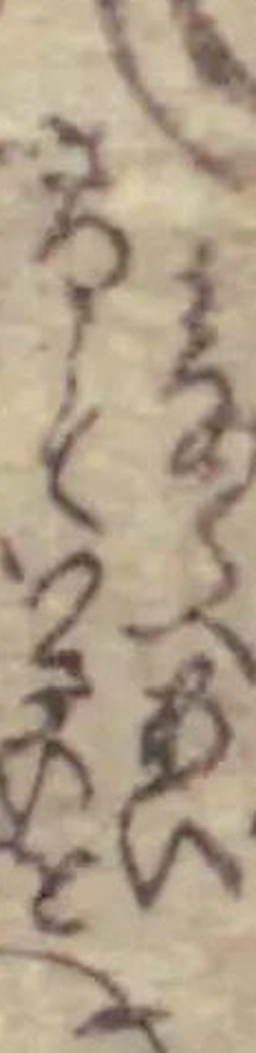さつしていさいを
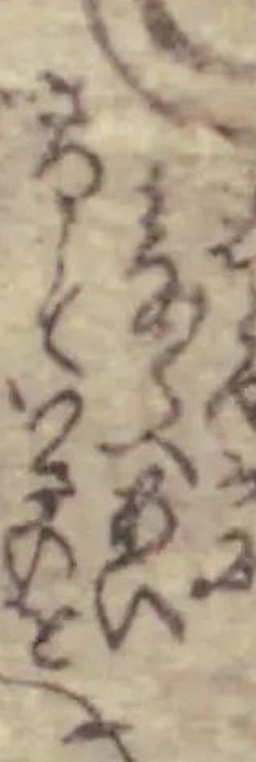さつしていさいを
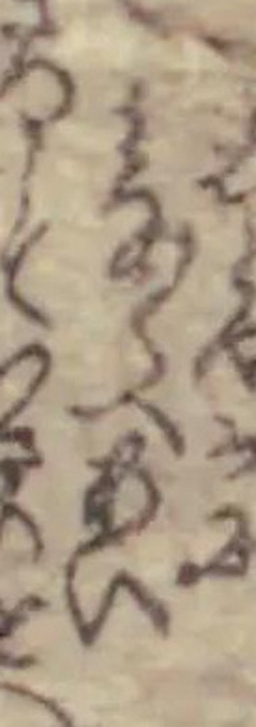さつしていさいを
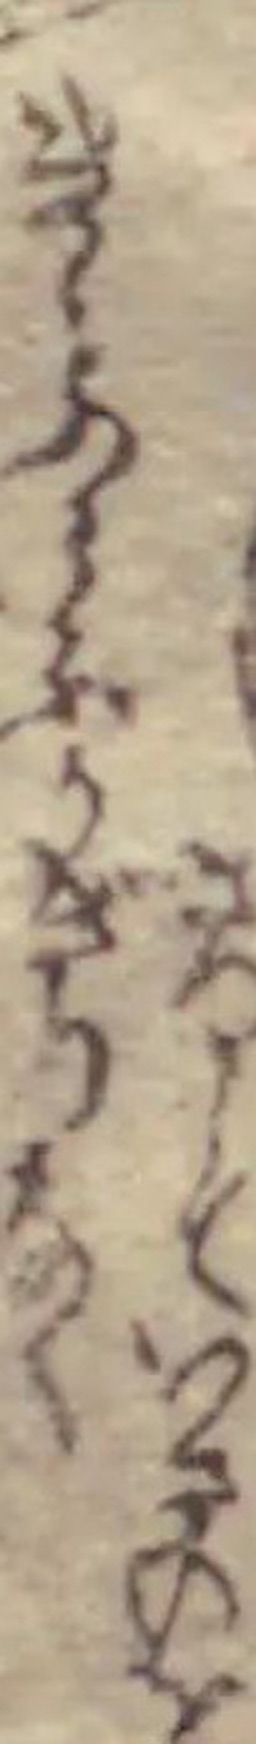きゝふうふかぎりなく
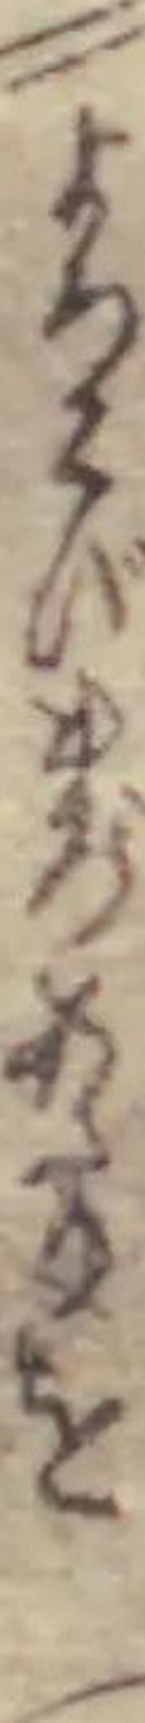よろこびまづあたりを
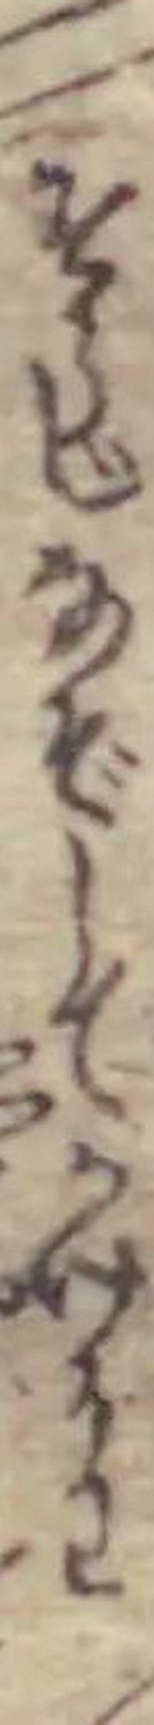そうじなぞしてかけうわ
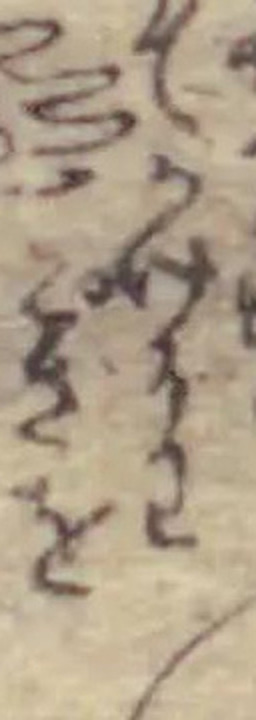ごさを
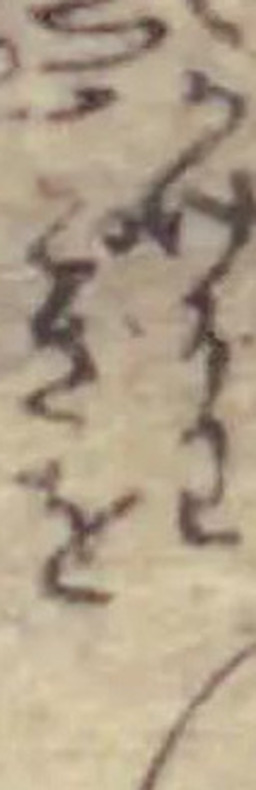ごさを
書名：飛た間違矢口噂 2巻
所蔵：国立国会図書館 National Diet Library, JAPAN
